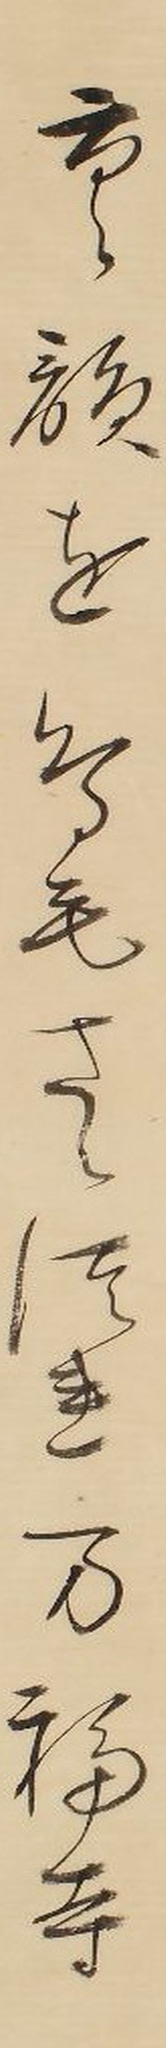重韻を鳥もさえつれ万福寺
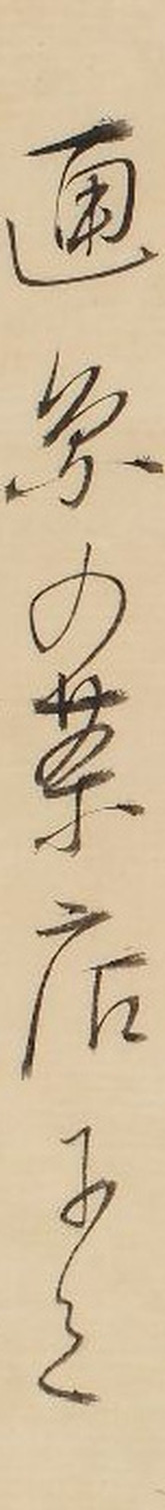通円の茶店にて
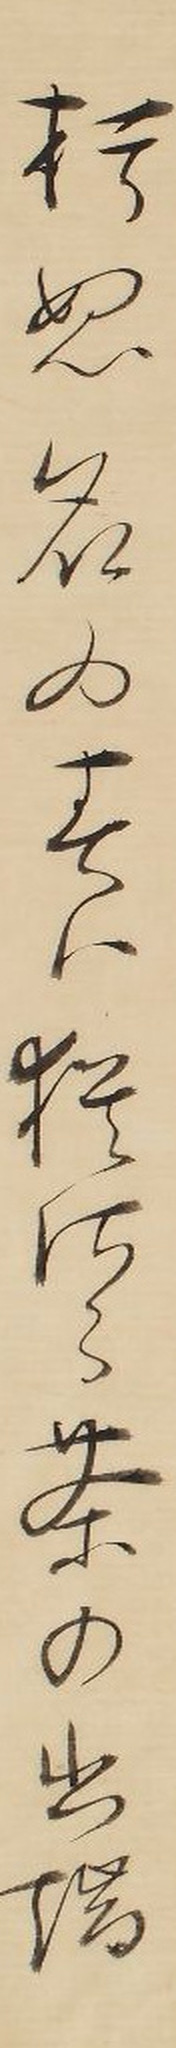朽ぬ名の春は猶さら茶の出端
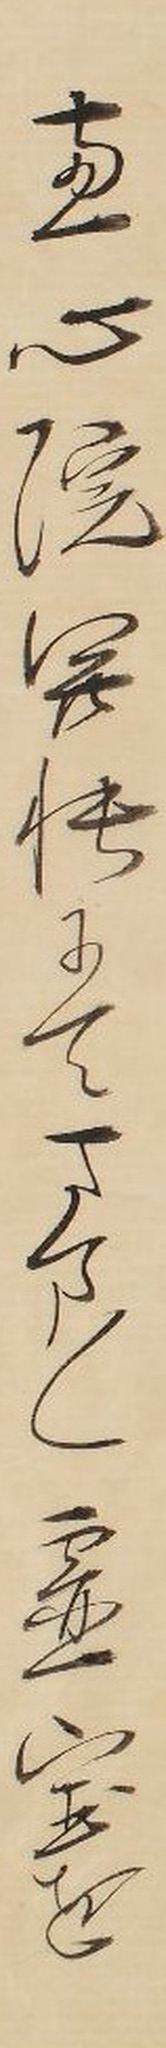恵心院開帳にてさま〳〵霊宝を
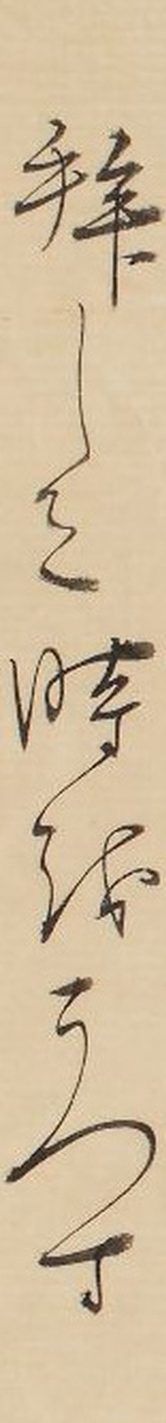拝して時をうつす
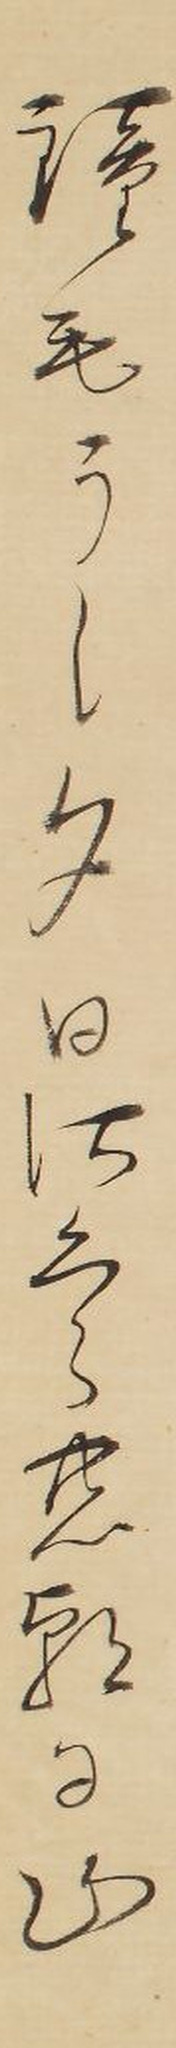鐘もうし夕日さくらの朝日山

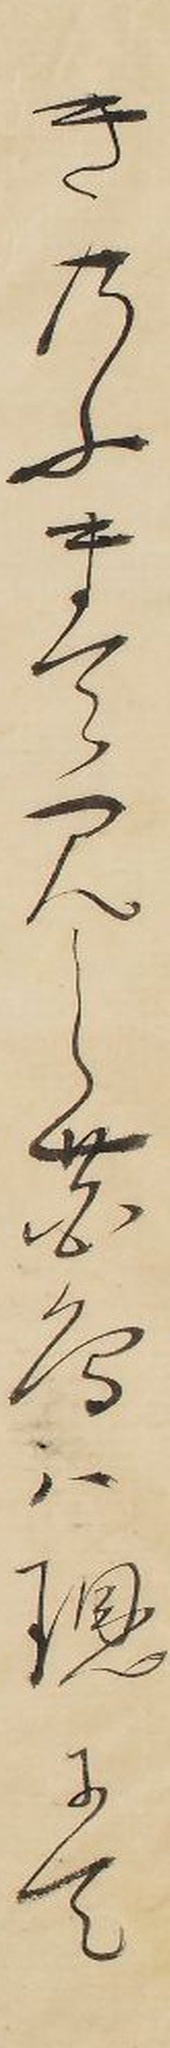きのふまて見し花鳥は現にて
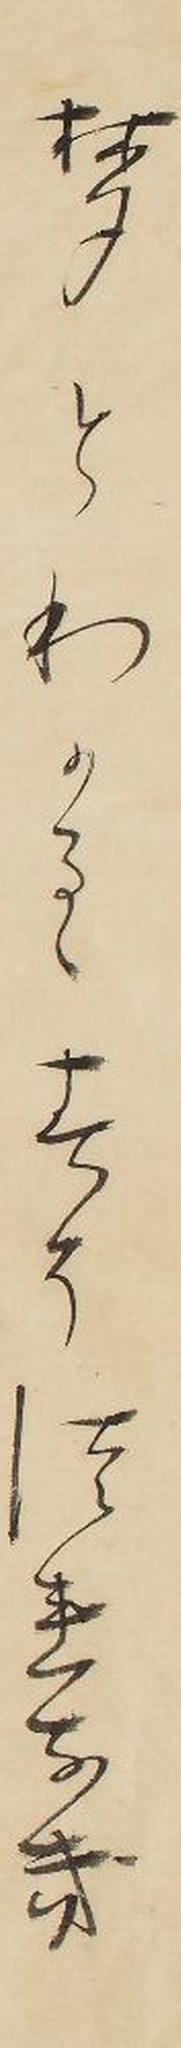夢とわかるゝ春そつれなき
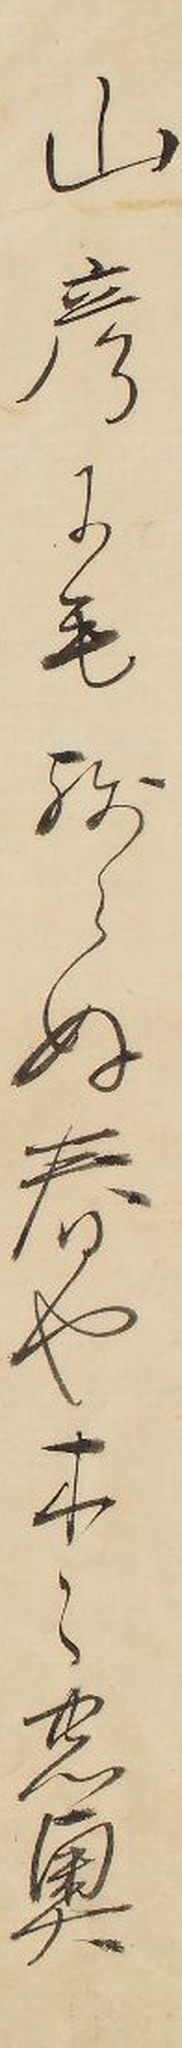山彦にも残らぬ春や木々の奥
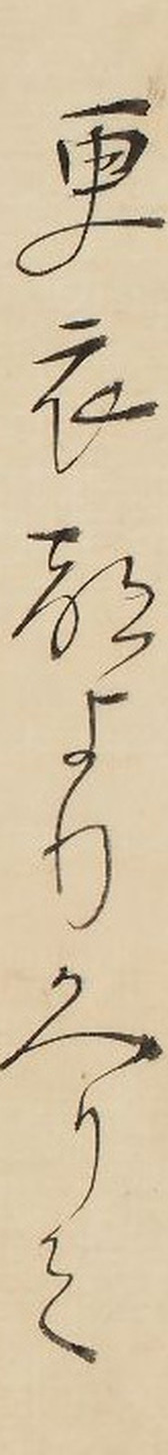更衣都よりかへりて
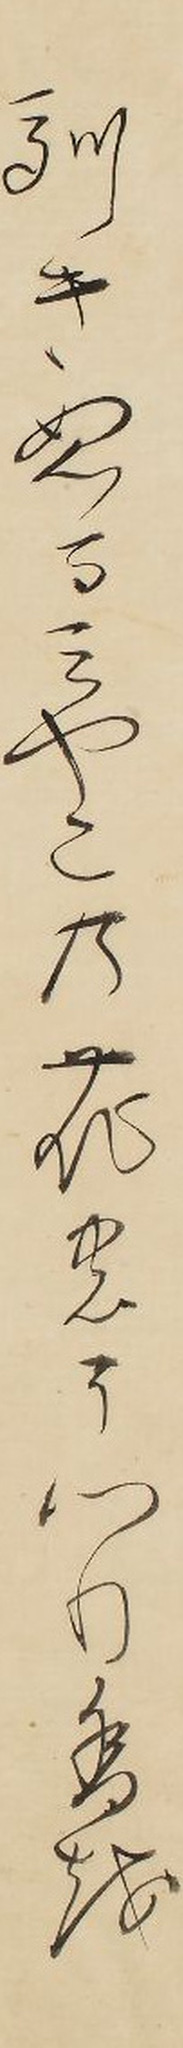馴きぬるみやこの花のうつり香を
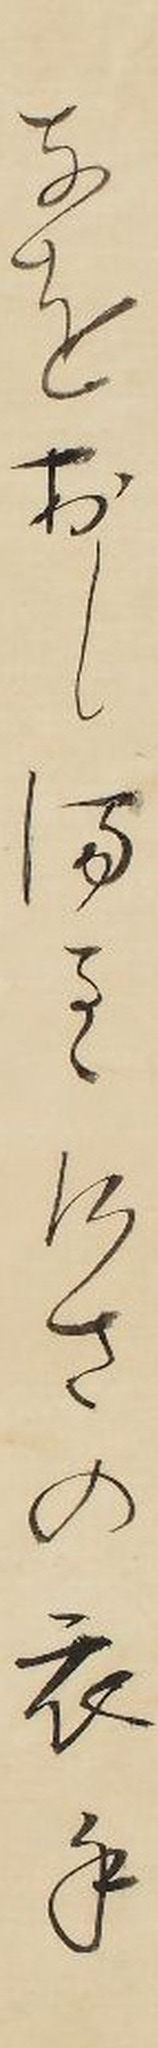なをおしまるゝけさの衣手
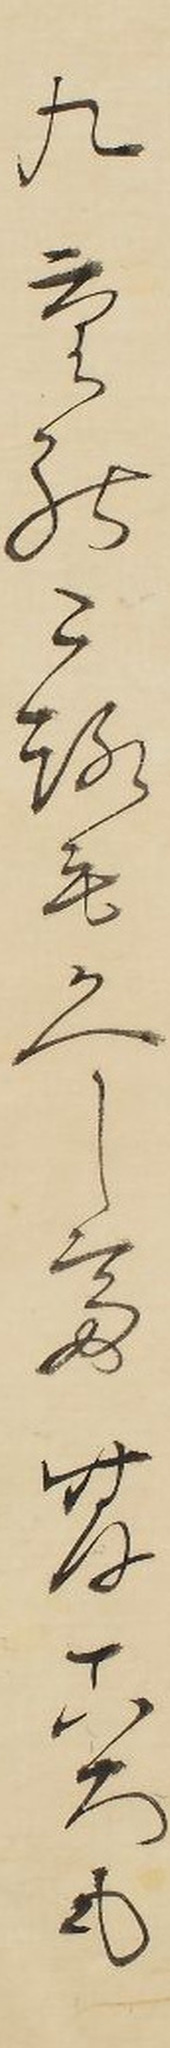九重のころもかへして夏ころも
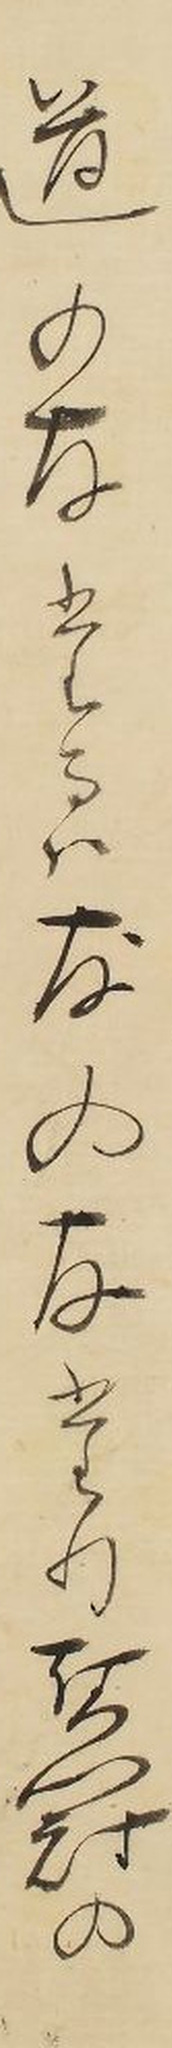道の友たるは友の友たり冠の
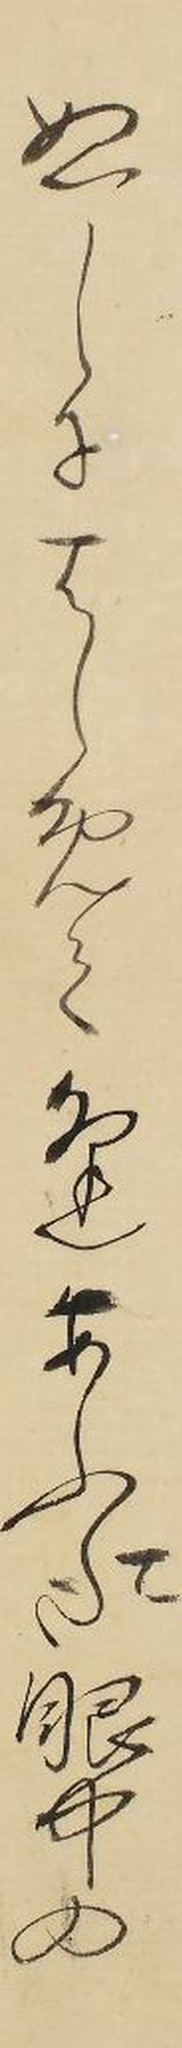ぬしにはしめて逢あふて眼中の
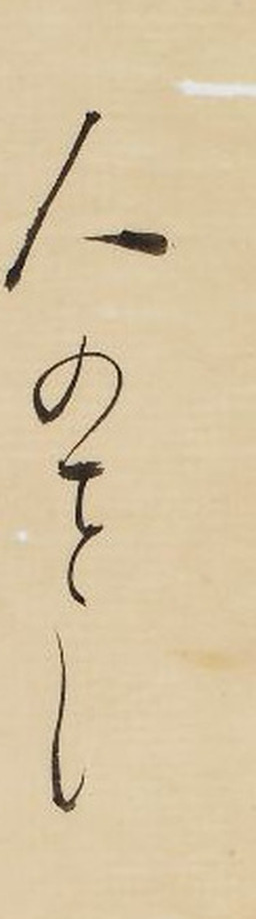人のことし
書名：花土産
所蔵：徳島県立図書館
